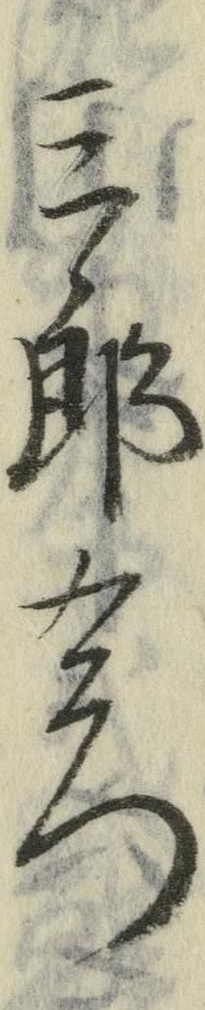三郎右衛門
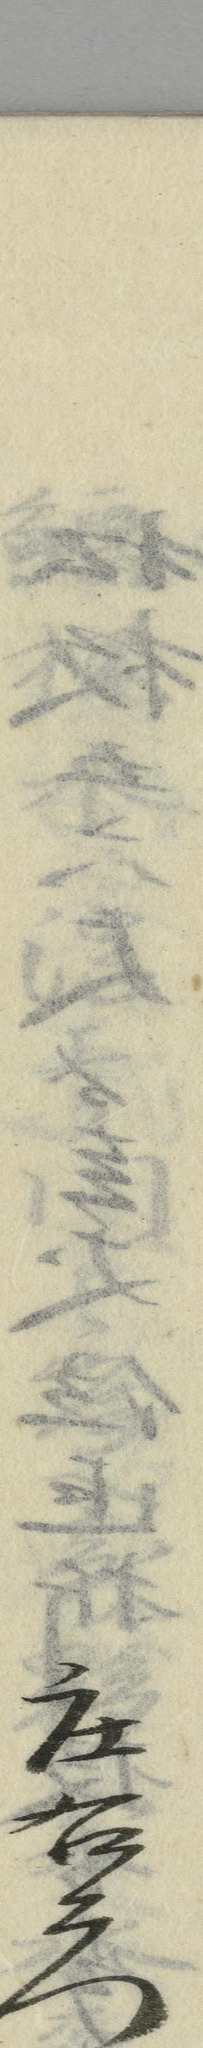庄右衛門
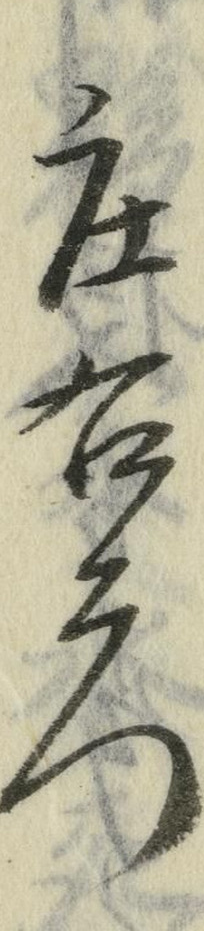庄右衛門
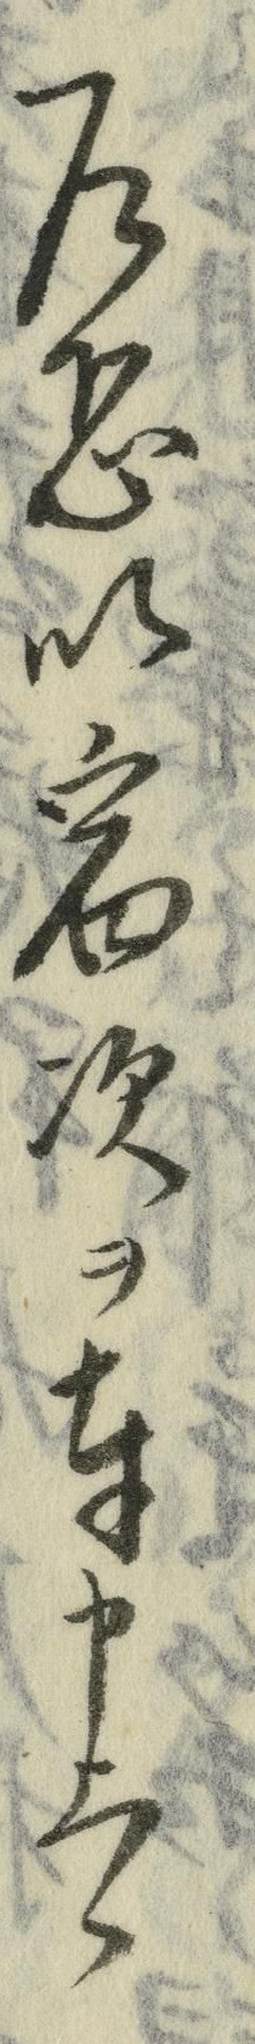乍恐以宿次ヲ奉申上候
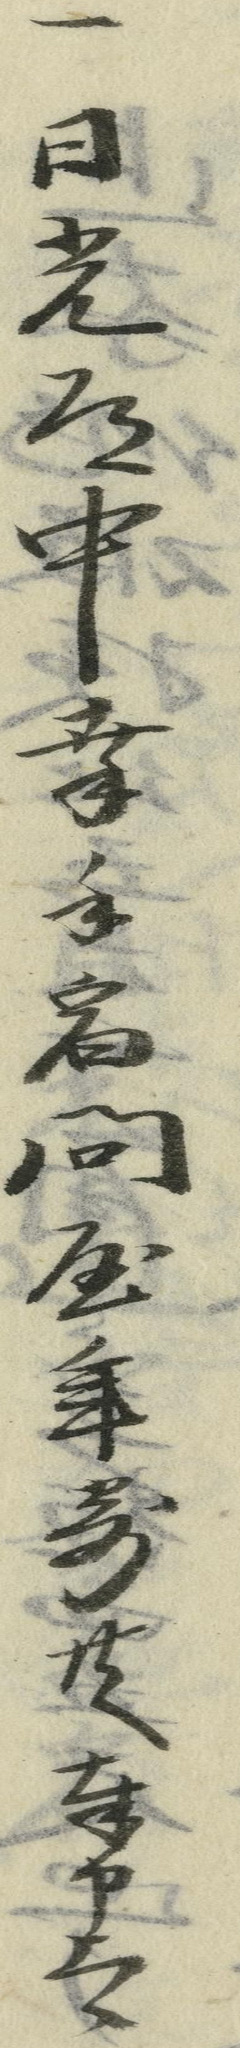一日光道中幸手宿問屋年寄共申上候
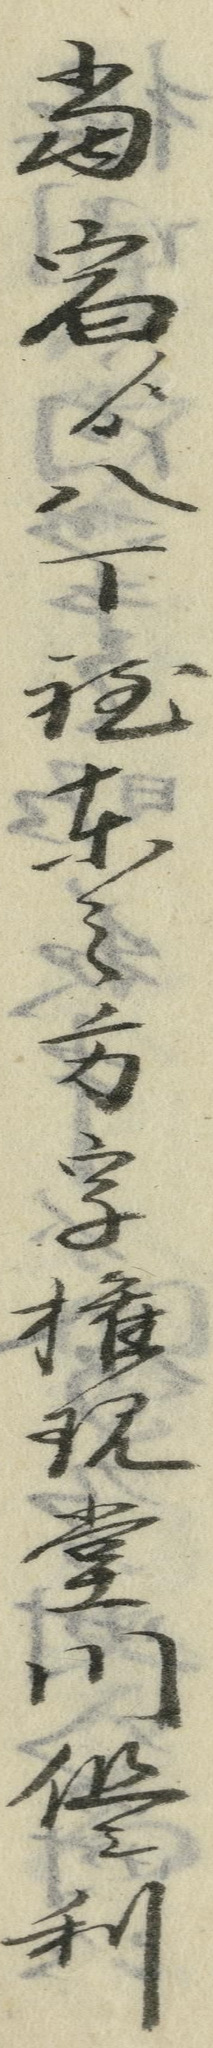当宿ゟ八丁程東之方字権現堂川但シ利

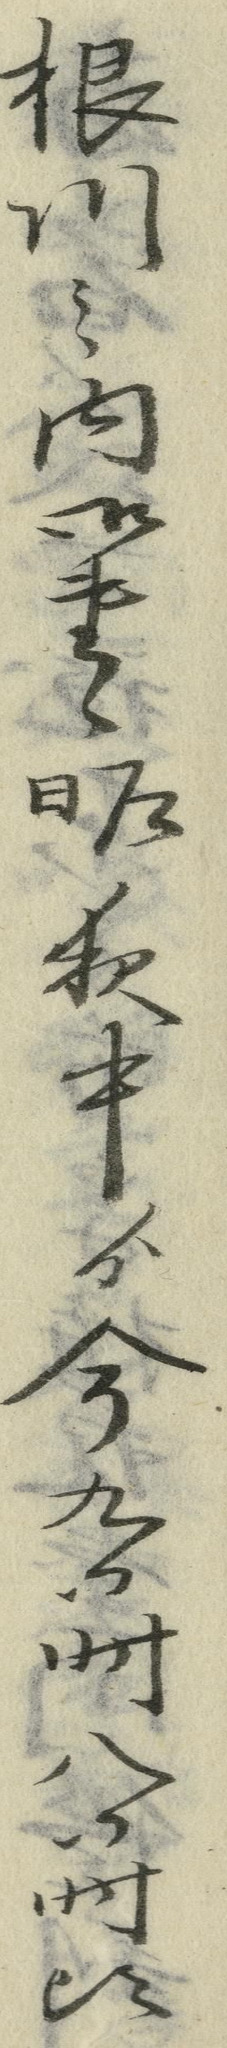根川之内御座候昨夜中より今九ッ時八ッ時頃
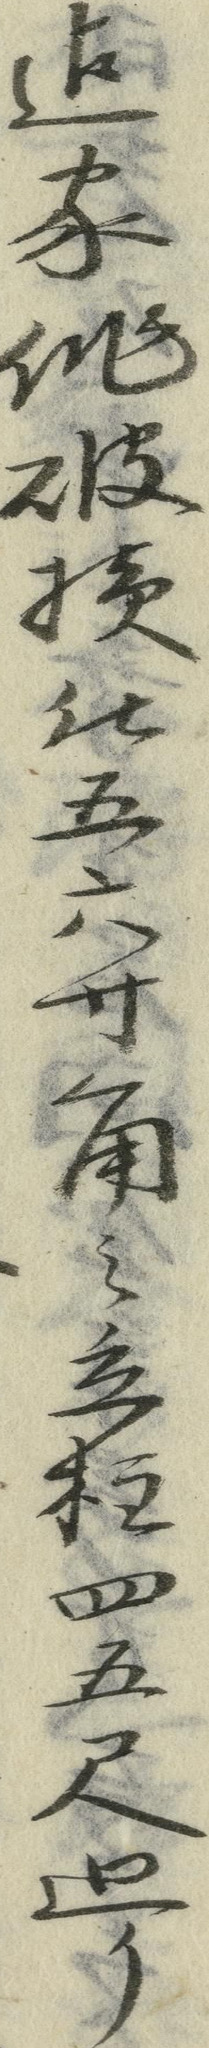迄家作破損仕五六寸角之立柱四五尺廻り
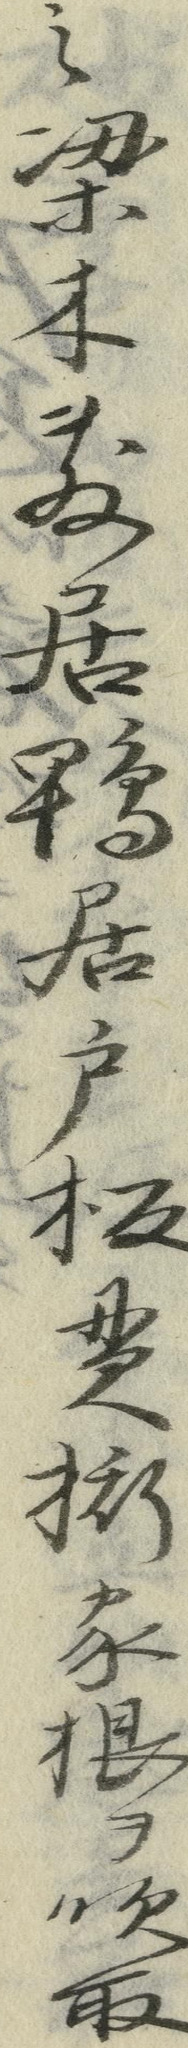之梁木敷居鴨居戸板貫桁家根ヲ吹取
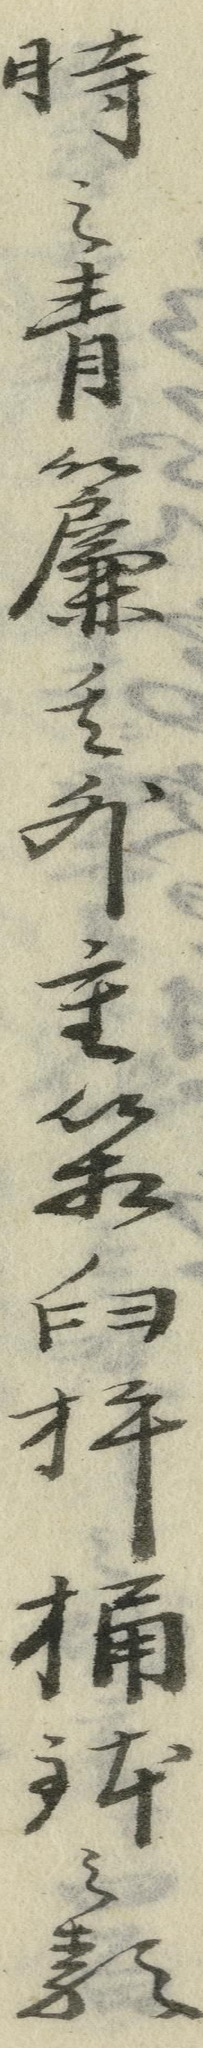時々青簏其外重箱臼杵桶鉢之類
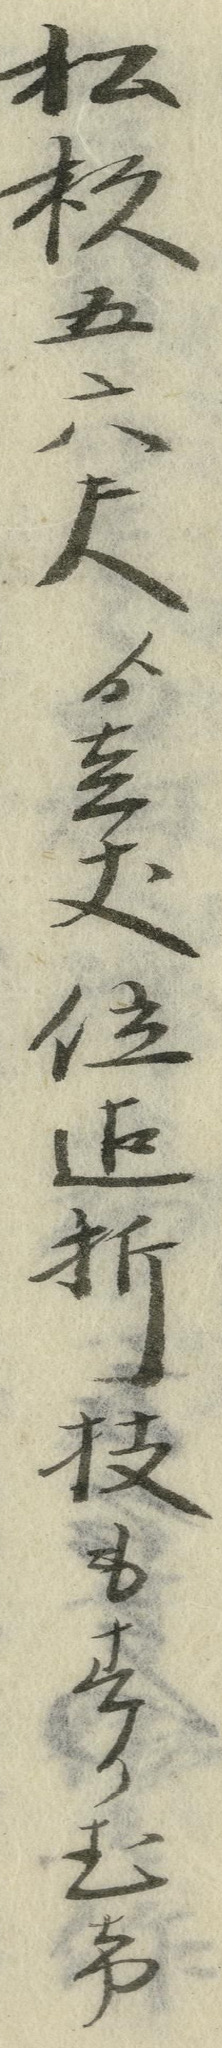松杉五六尺ゟ壱丈位迄折枝もすりむけ
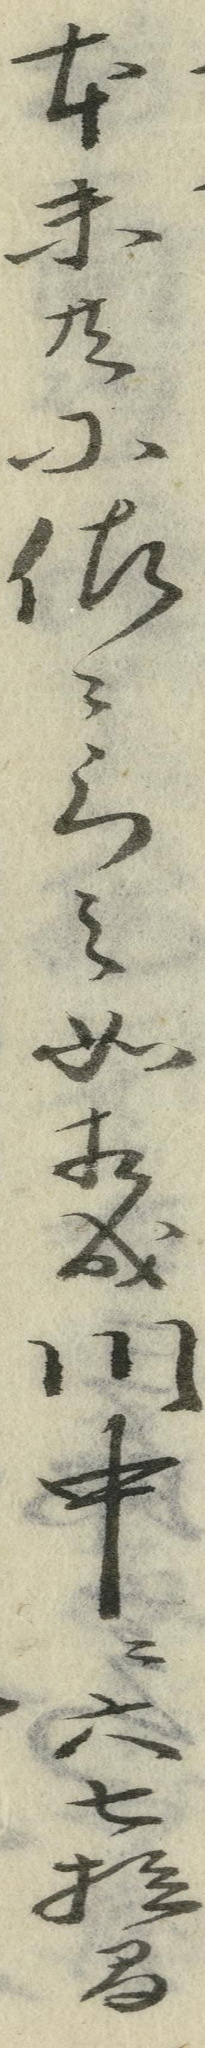本末共に佐々ら之如相成川中ニ六七拾間
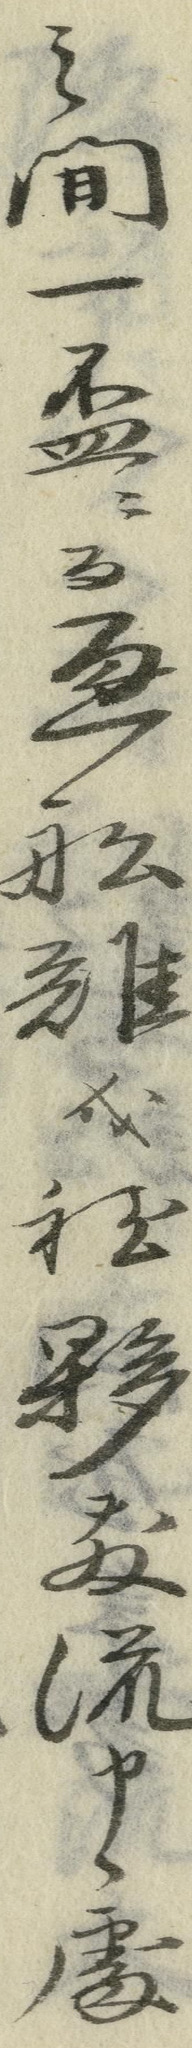之間一盃ニ而通船難成程夥敷流申候処
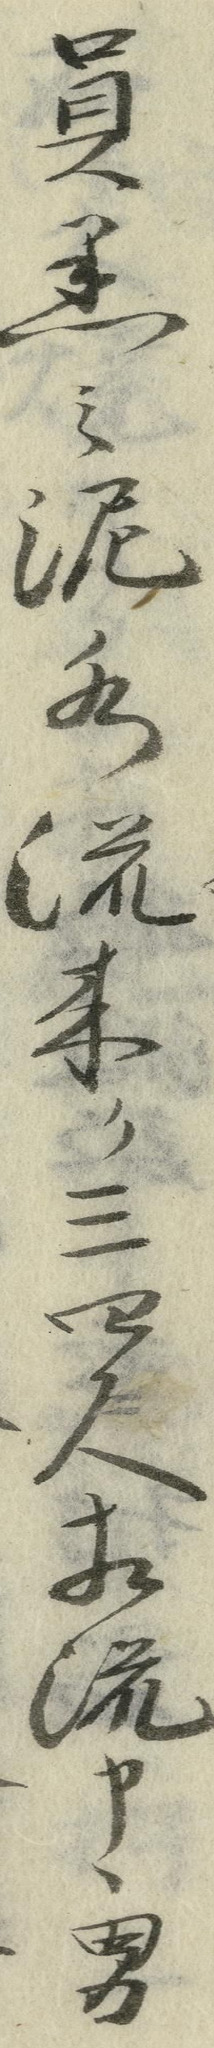員黒之泥水流来リ三四尺相流申候男
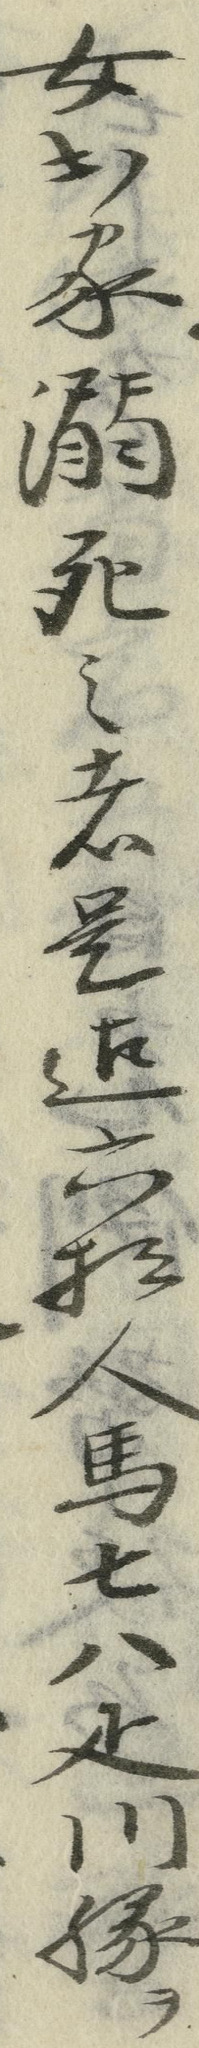女出家溺死之者是迄六拾人馬七八疋川縁ヲ
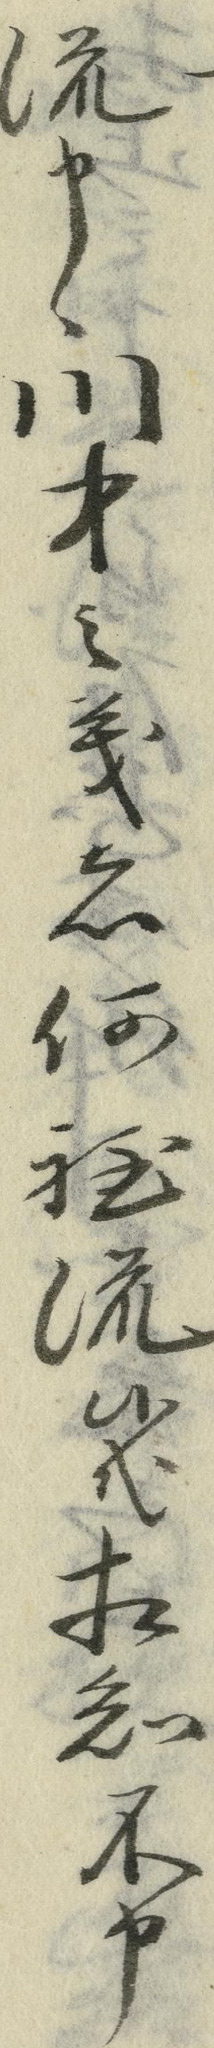流申候川中之義者何程流候哉相知不申
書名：天明三癸卯七月信州浅間山焼出シ上州山津浪ニ付近國ヨリ御届書并訴書写
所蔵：東京大学地震研究所図書室 Earthquake Research Institute Library, The University of Tokyo, JAPAN
